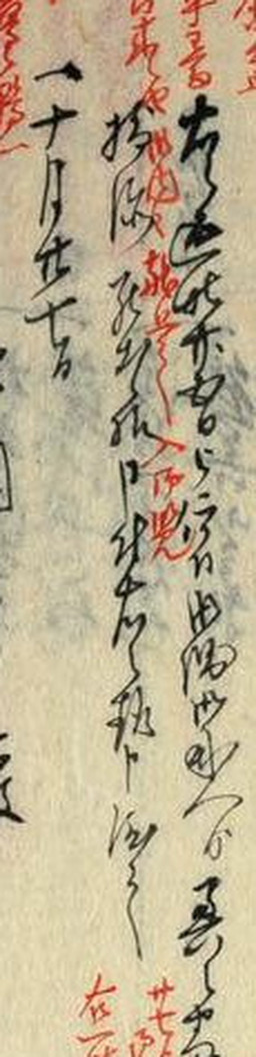指添罷出候様申付右之趣申渡之
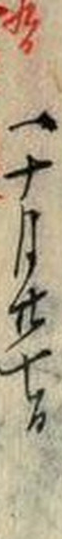一十月廿七日
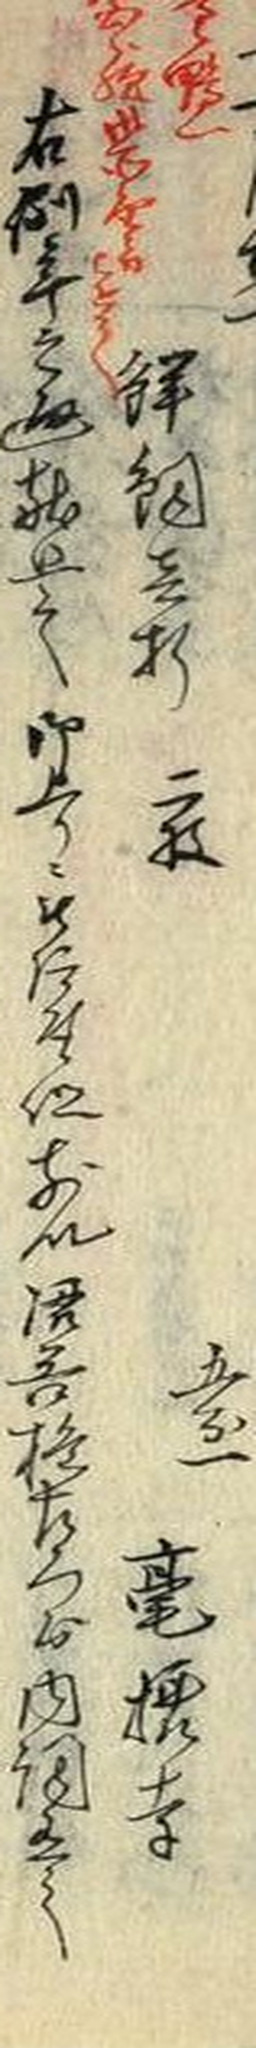右例年之通献上之御上りニ被仰付候但前以渋谷権左衛門ゟ内調有之
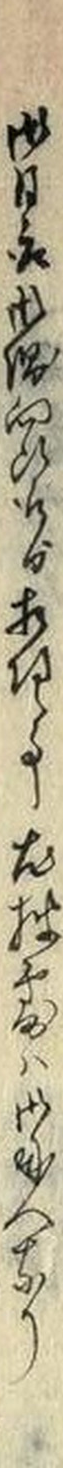御日取御側向頭取ゟ相伺候事尤披露ハ御用人なり
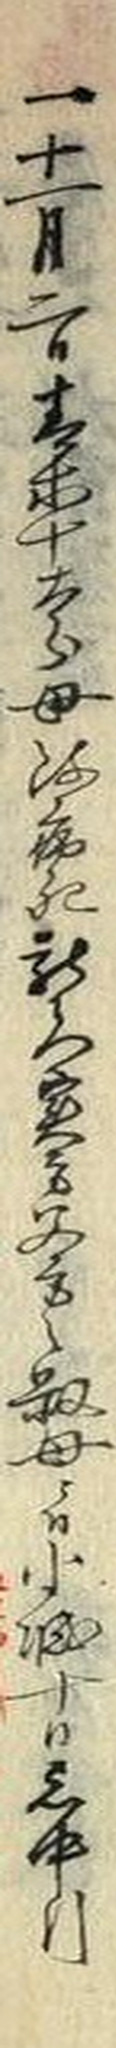一十一月二日青木十太郎母致病死新右衛門実方父方之叔母ニ付半減十日忌中引
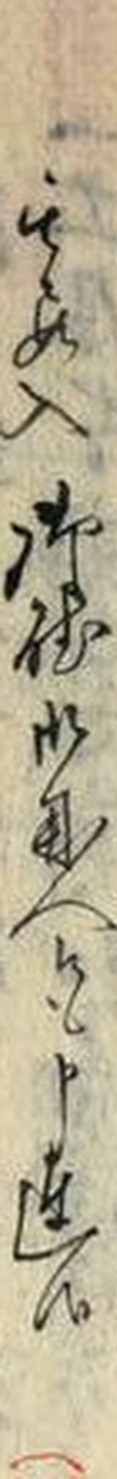其段入御聴御用人江も申達候
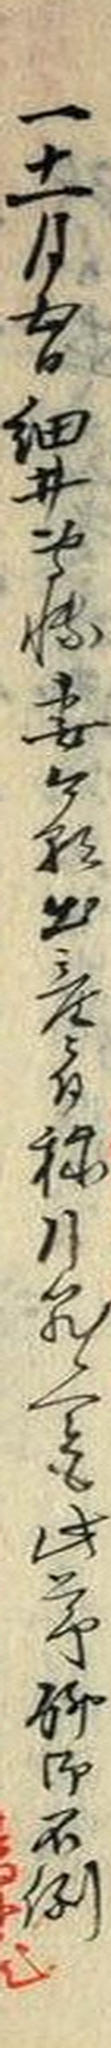一十一月五日細井専博妻今朝出産ニ付穢引籠候ヘとも此節聊御不例
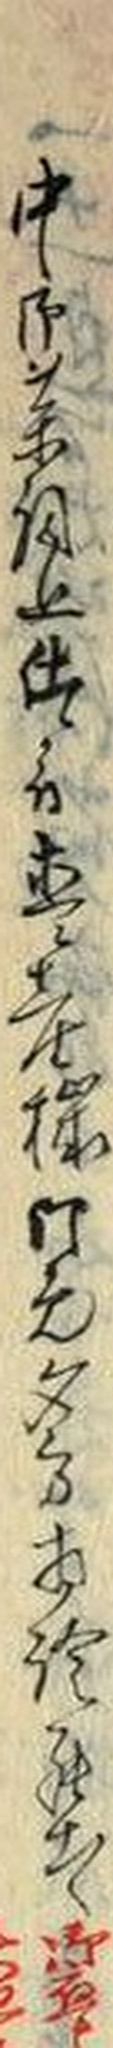中御薬調上仕候ニ付直ニ産穢御免夕方拝診罷出候

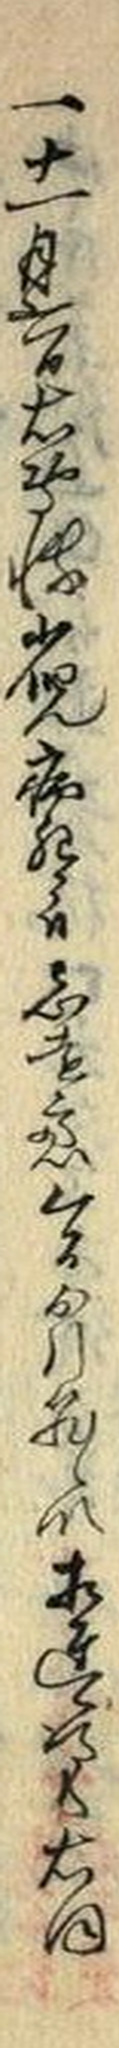一十一月六日右専博少児病死ニ付忌遠慮今日ゟ引籠候段相達候得共右同
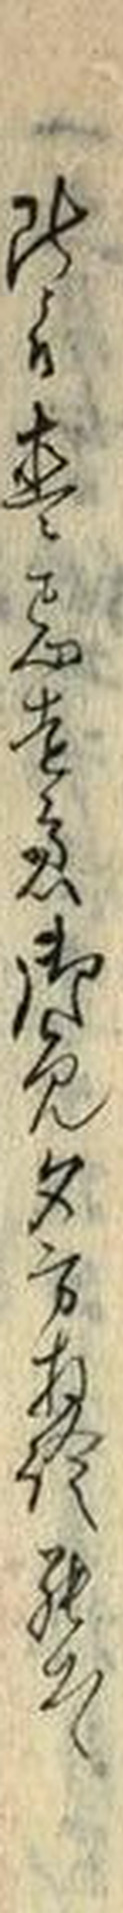断ニ付直ニ忌遠慮御免夕方拝診罷出候
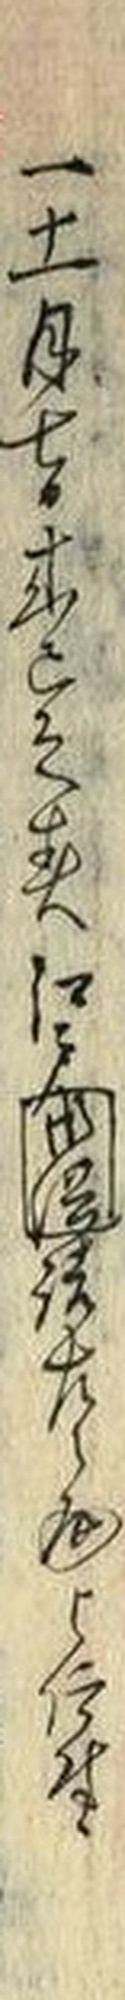一十一月七日来己之春江戸御供詰左之通被仰付候

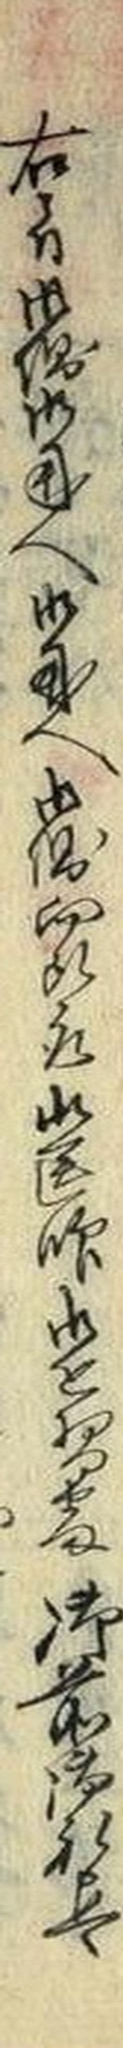右ニ付御側御用人御用人御側向頭取御医師御近習番御前御礼申上候
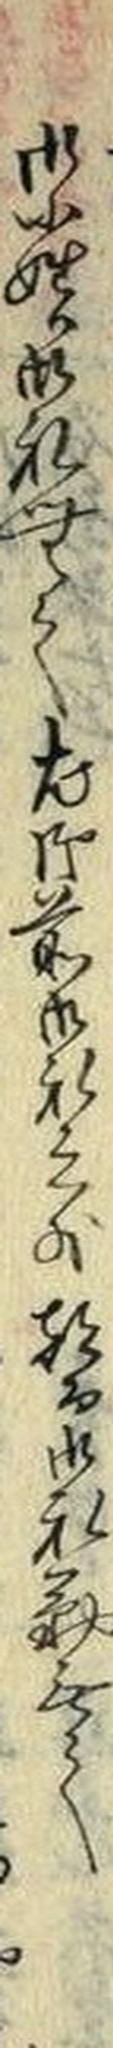御小姓ハ御礼無之尤御前御礼之外都而御礼勤無之
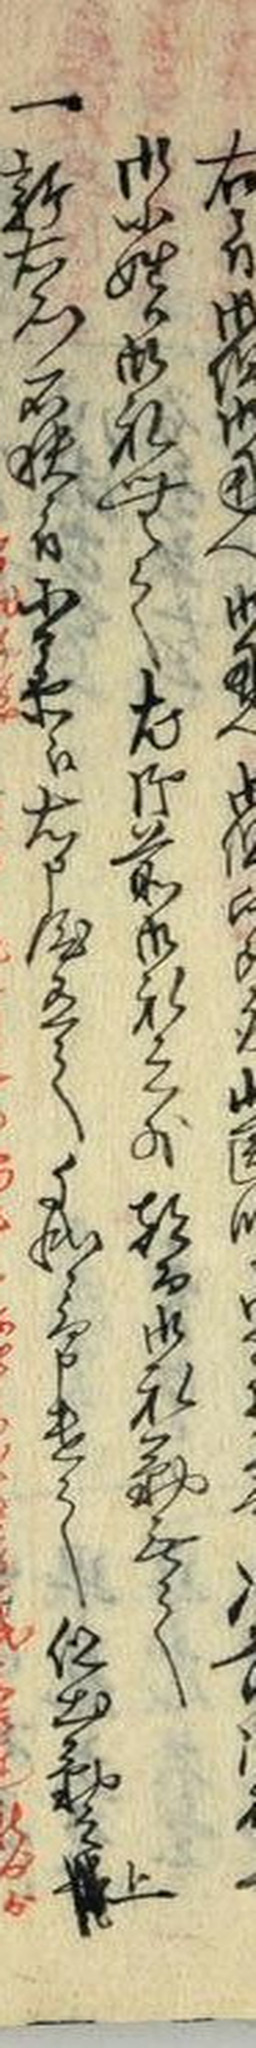一新右衛門不快ニ付小兵衛江右申渡有之手紙ニ而申遣之但出勤之上
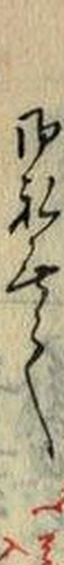御礼無之
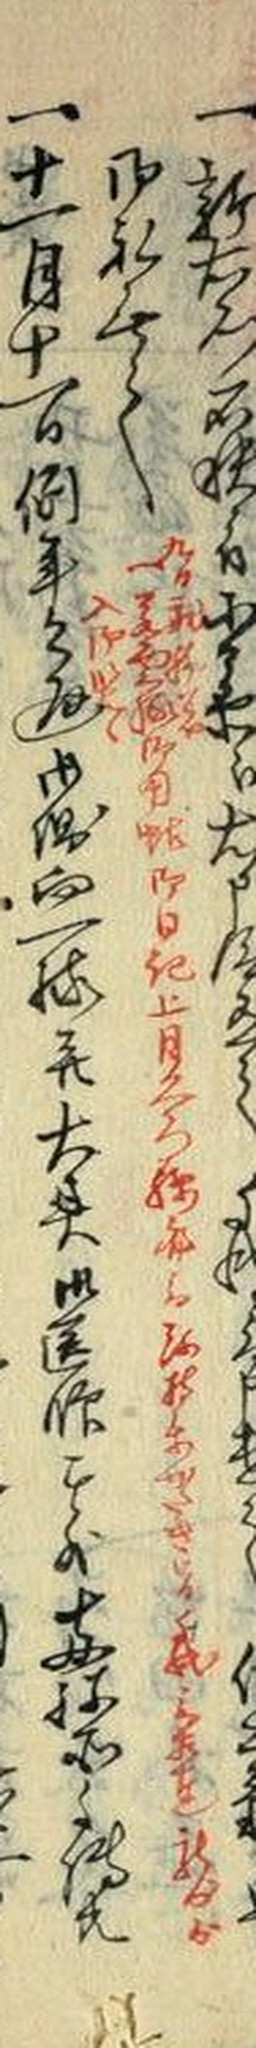一十一月十一日例年之通御側向一統幷大奥御医師其外両役所手伝共
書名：少傅日録抄（斉承付側向頭取日記、在国）
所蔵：福井県文書館 Fukui Prefectural Archives
